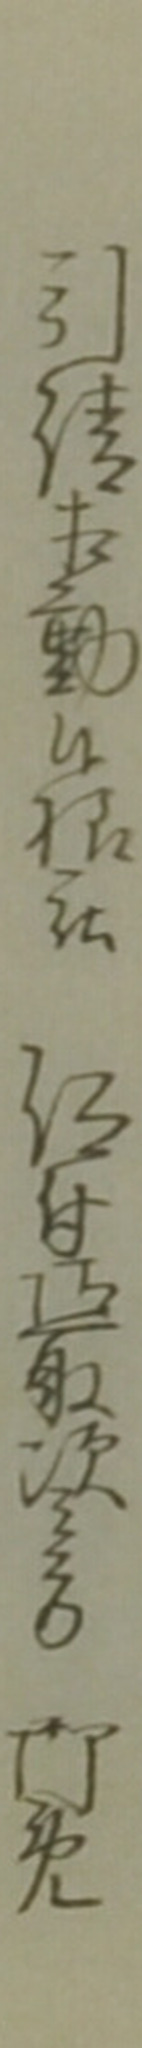引請相勤候様被仰付御取次之方御免
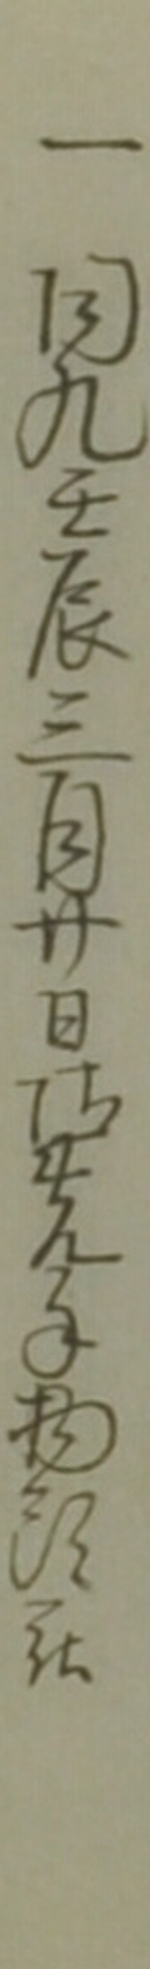一同九壬辰三月廿日御先手物頭被
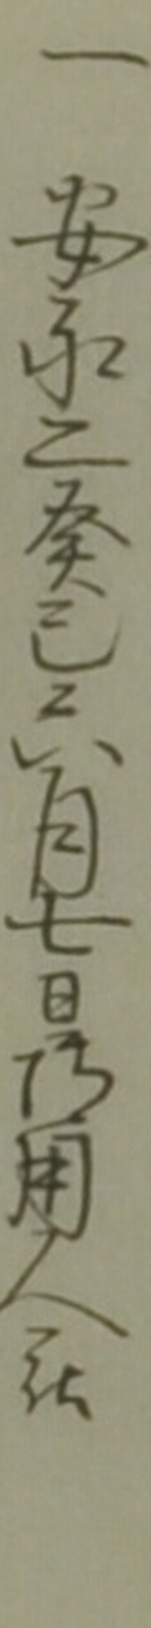一安永二癸巳六月七日御用人被
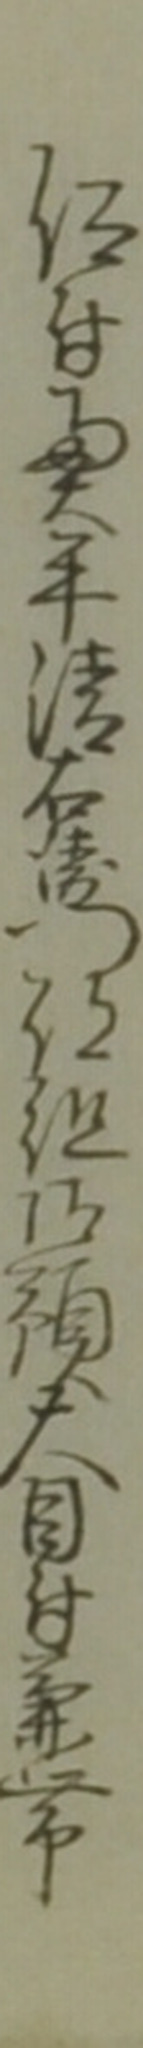仰付奥平清右衛門跡組御預大目付兼帯
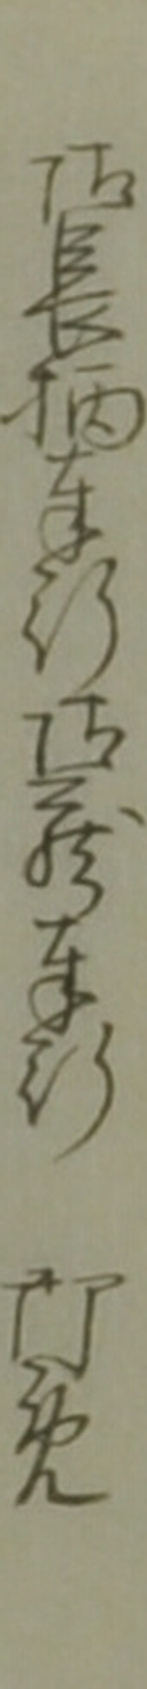御長柄奉行御蔵奉行御免
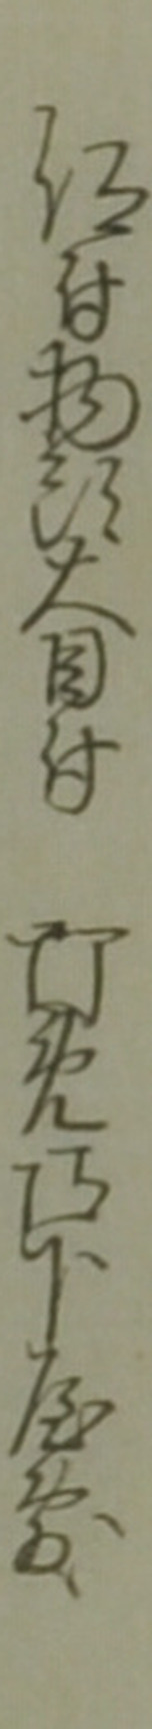仰付物頭大目付御免御下屋敷

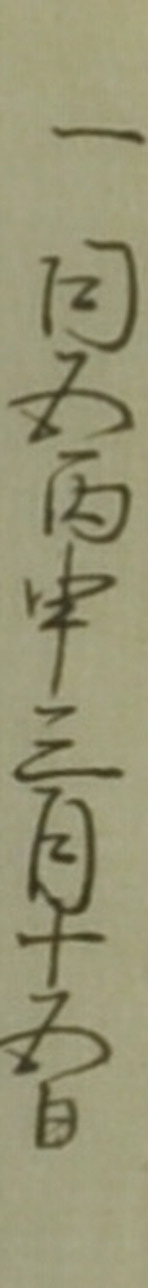一同五丙申三月十五日
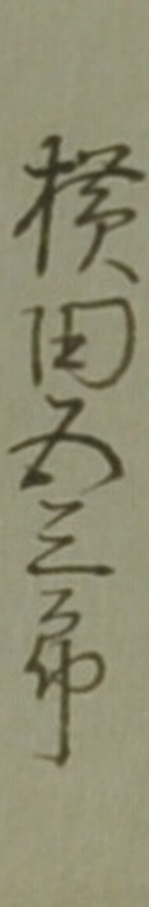横田五三郎
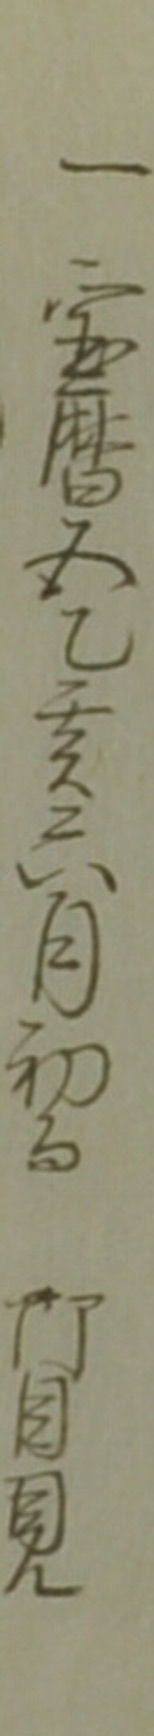一宝暦五乙亥六月初而御目見
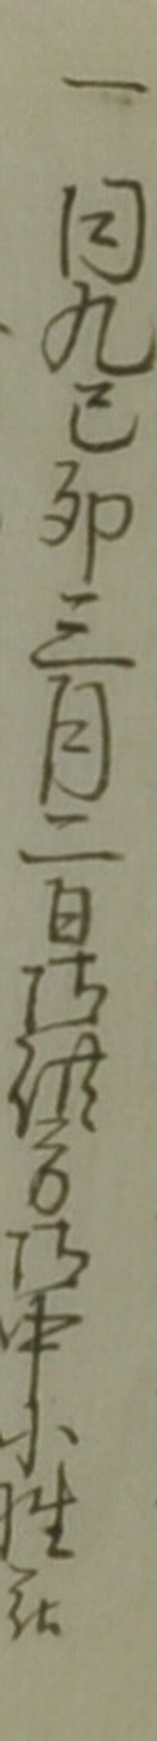一同九己卯三月二日御供方御中小性被
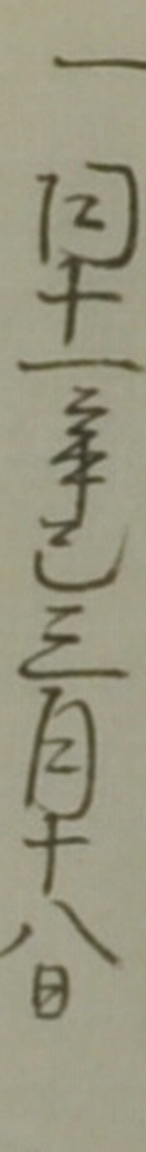一同十一辛己三月十八日
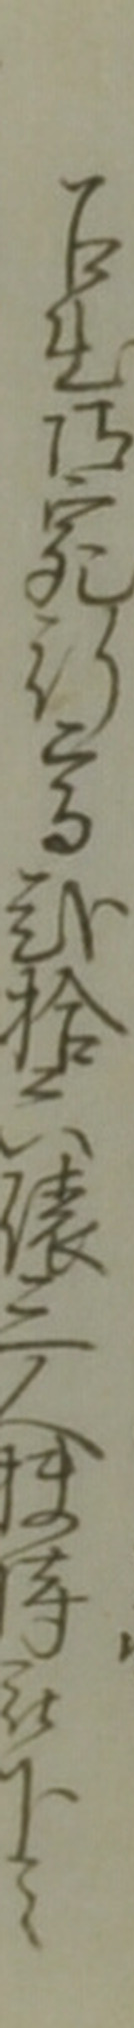召出御宛行高弐拾六俵二人扶持被下候
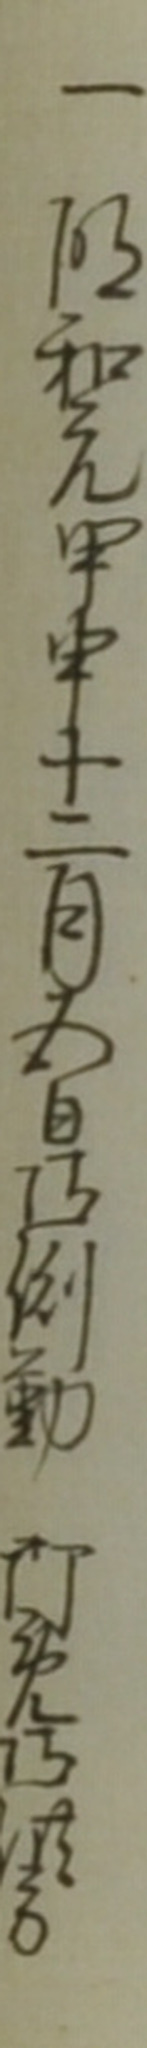一明和元甲申十二月五日御側勤御免御供方
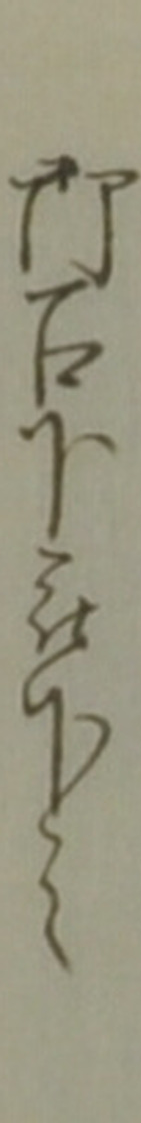御召下被下候
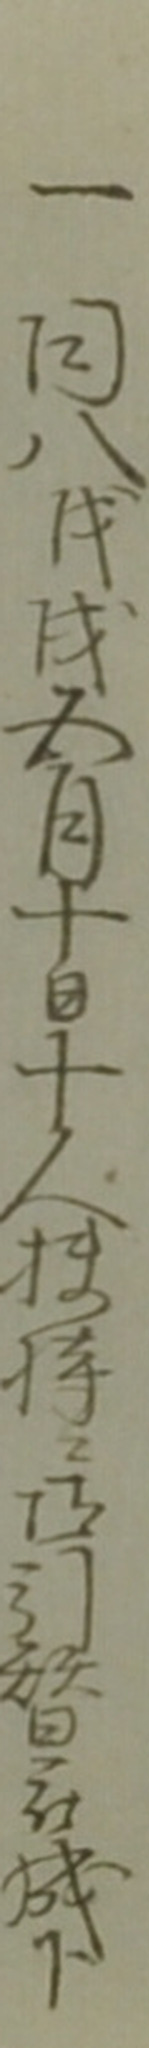一同八戊戌五月十日十人扶持二御引替被成下
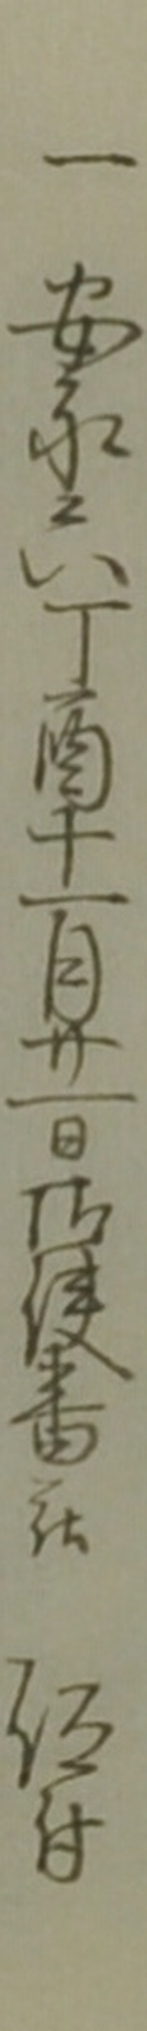一安永六丁酉十一月廿一日御使番被仰付
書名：給人諸士勤仕録（三）
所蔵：伊那市立高遠町図書館・合同会社AMANE
